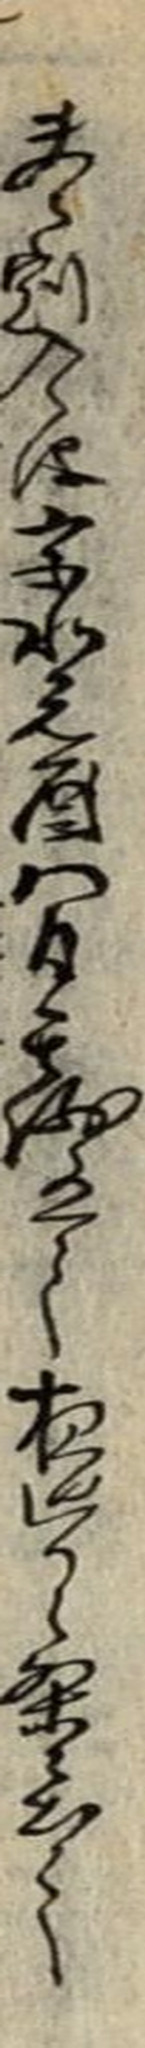夫々割入候儀享和元酉八月其例有之夜廻り之条に出之
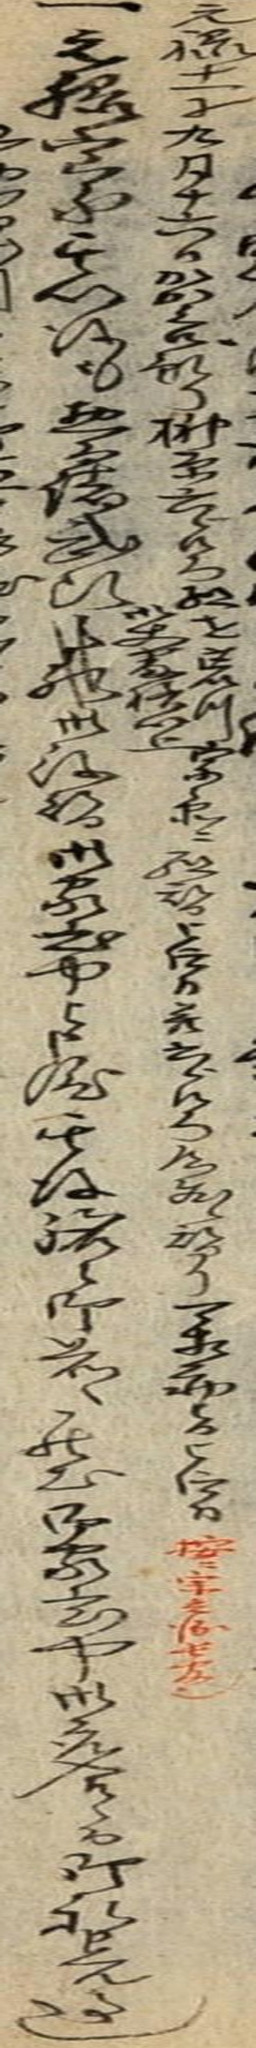一元禄宝永其以後も惣而諸武頭御使番格以上御役替御家老中被申渡其後銘々御前へ罷出御家老中御取合に而御礼申上ル事也
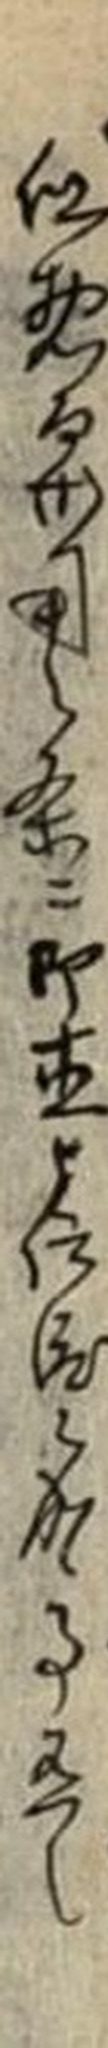但惣而御用之条に御直被仰渡被成候事有之
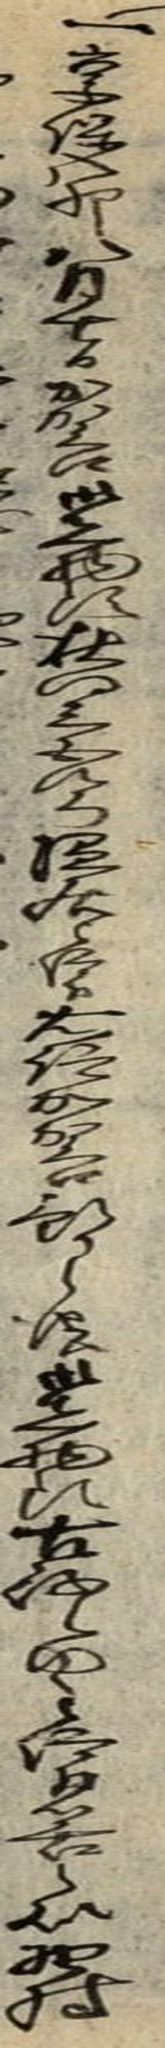一享保八卯八月七日加賀口御先物頭秋田三五左衛門隠居被仰付右跡加賀口預り之儀は御先物頭古役之内へ被仰付候筈之処野村
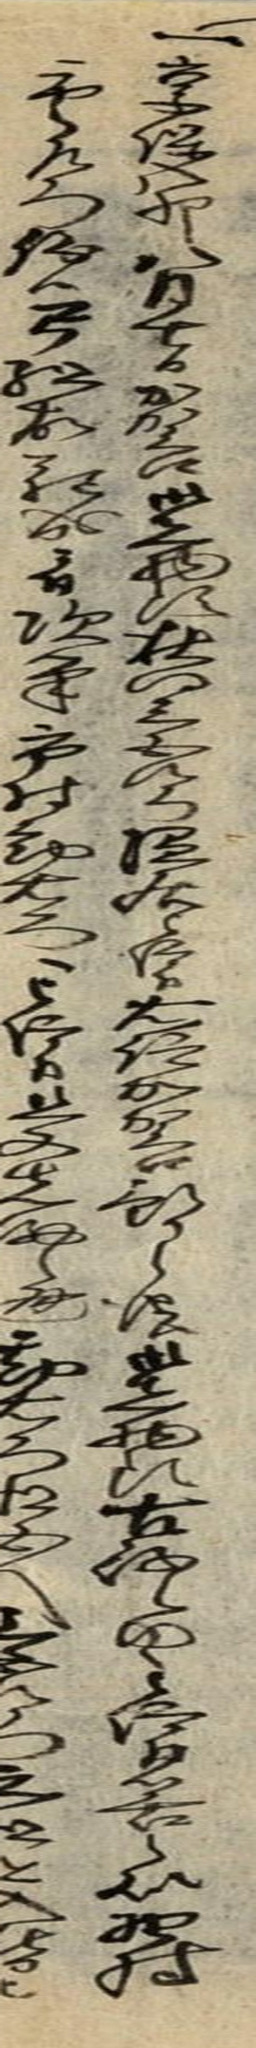市郎左衛門儀は弓組故難成に付次筆市村勘右衛門へ被仰付且又先例之通勘右衛門組五人三五左衛門元組と入替被
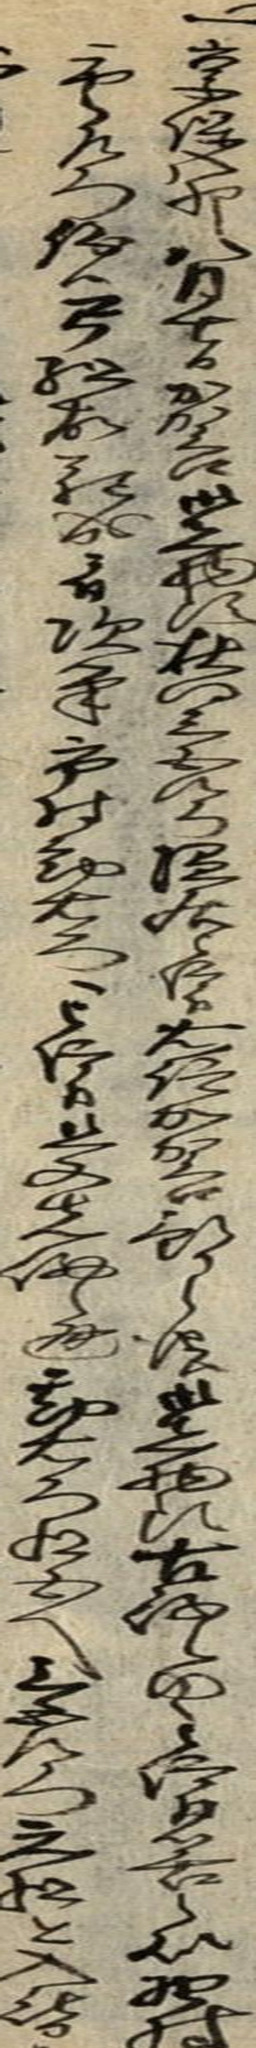市郎左衛門儀は弓組故難成に付次筆市村勘右衛門へ被仰付且又先例之通勘右衛門組五人三五左衛門元組と入替被
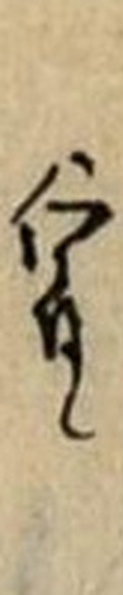仰付候
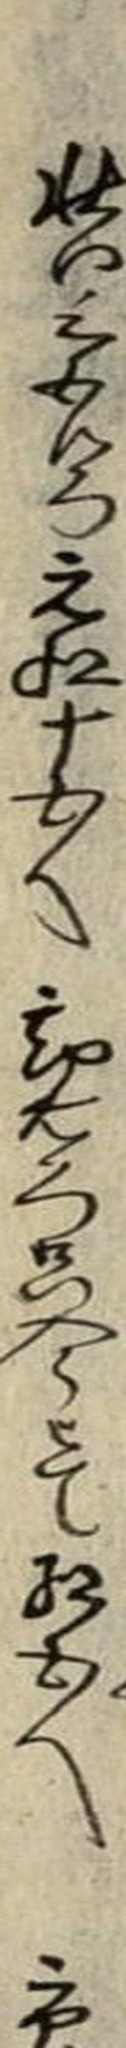秋田三五左衛門元組十五人勘右衛門只今迄之組拾五人
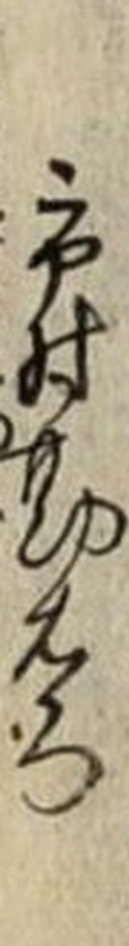市村勘右衛門
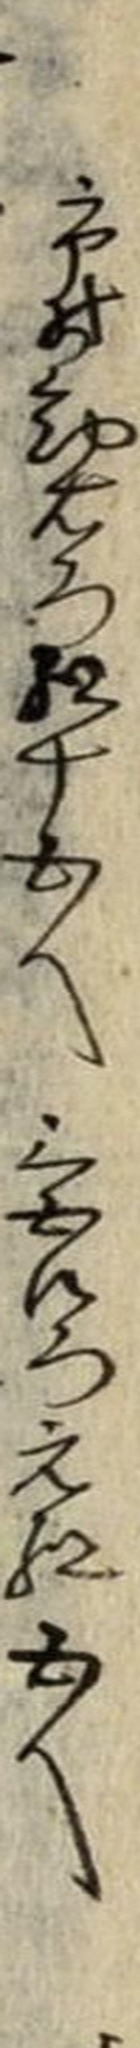市村勘右衛門組十五人三五左衛門元組五人
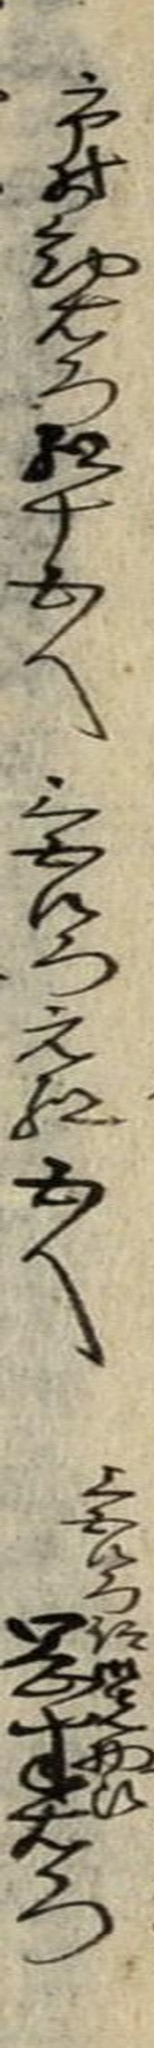市村勘右衛門組十五人三五左衛門元組五人
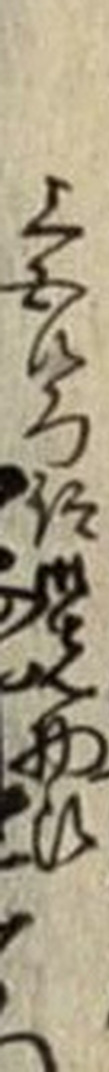三五左衛門跡御先物頭
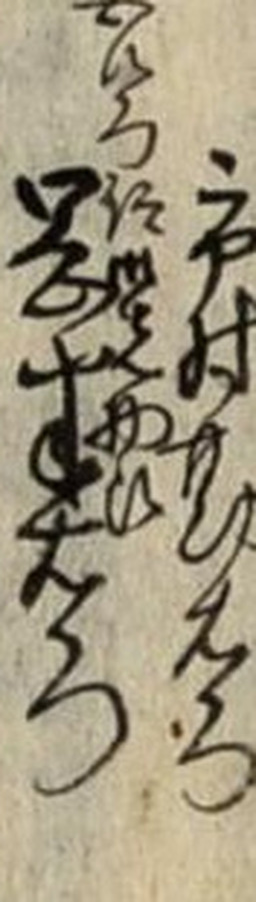岡半右衛門
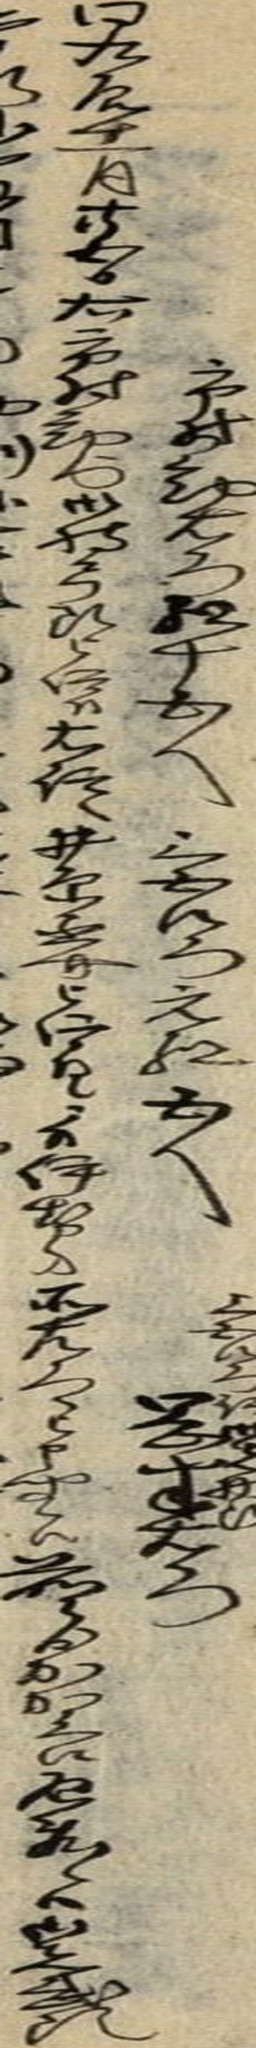一同九辰十一月廿五日右市村勘右衛門御持弓頭被仰付右跡へ井原丞介被仰付候に付伊勢方所左衛門へ被申聞候は前々ゟ加賀口屋敷へは御先武頭
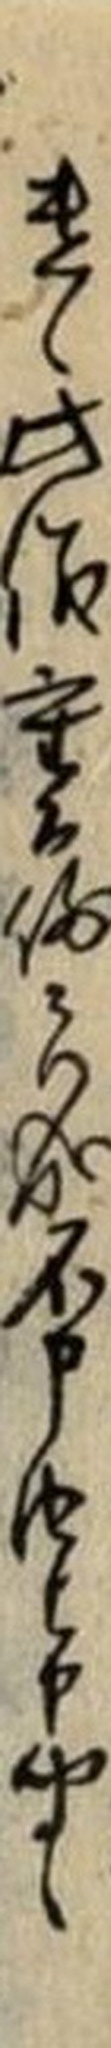遣候此儀重而例には成不申由被申聞候
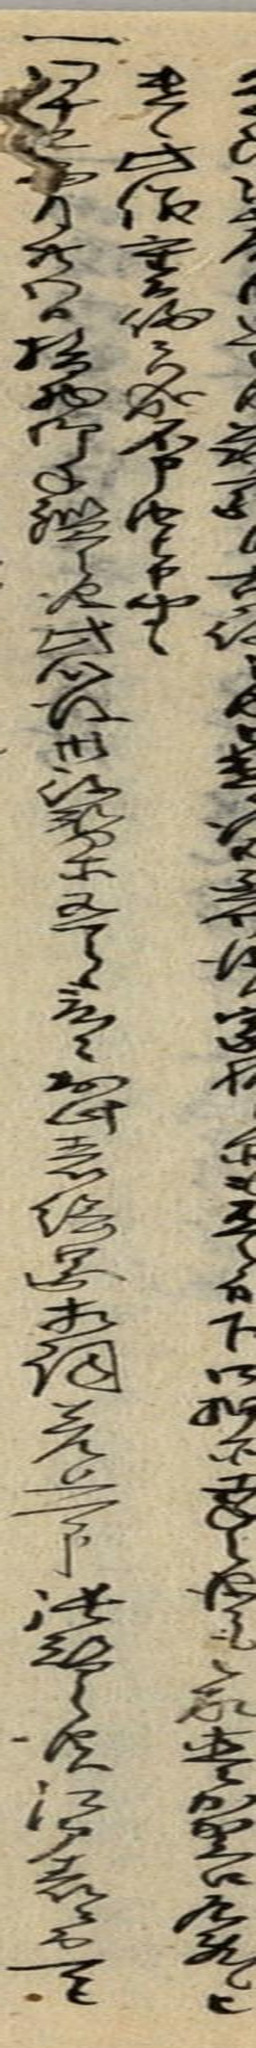一同十巳五月廿八日指物御手鑑之儀此以後御役替等有之度々於此表絵図相調差上可申張替候儀は江戸表に而可被
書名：御用并被仰出之部
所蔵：福井県文書館 Fukui Prefectural Archives
